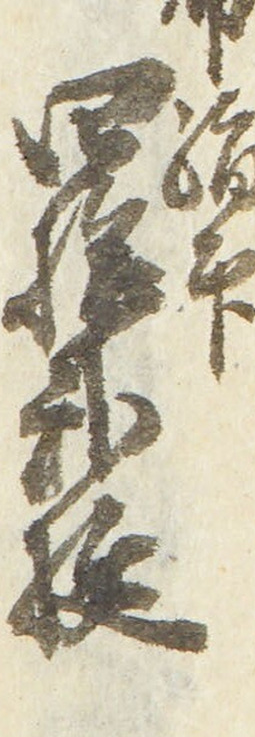四拾弐挺

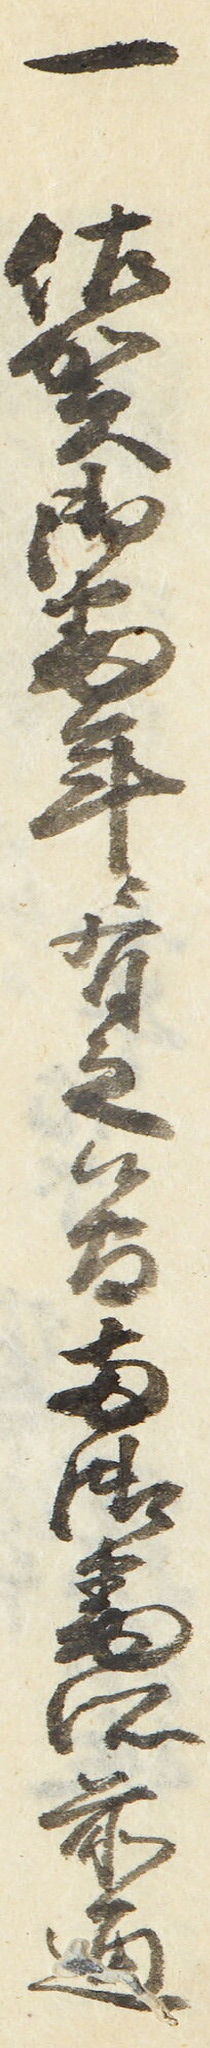一佐賀御番年ニ有之候間両御番所前通
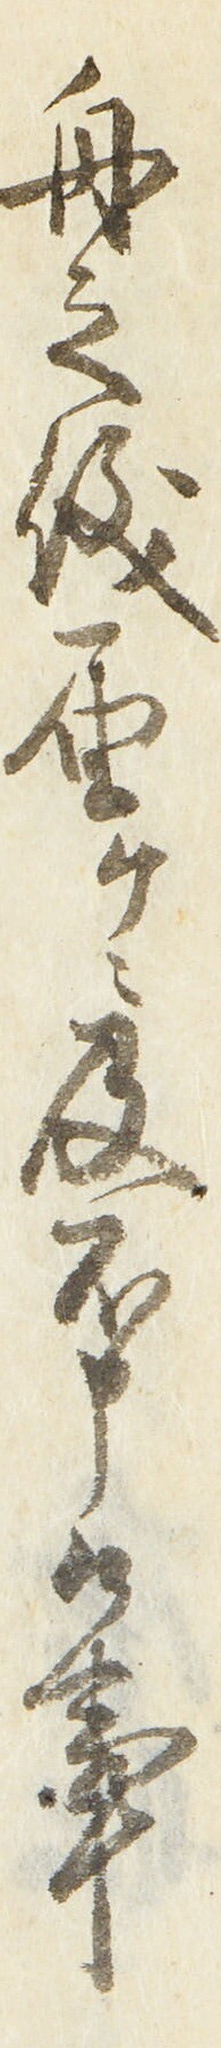舟之儀届ケ及不申候事
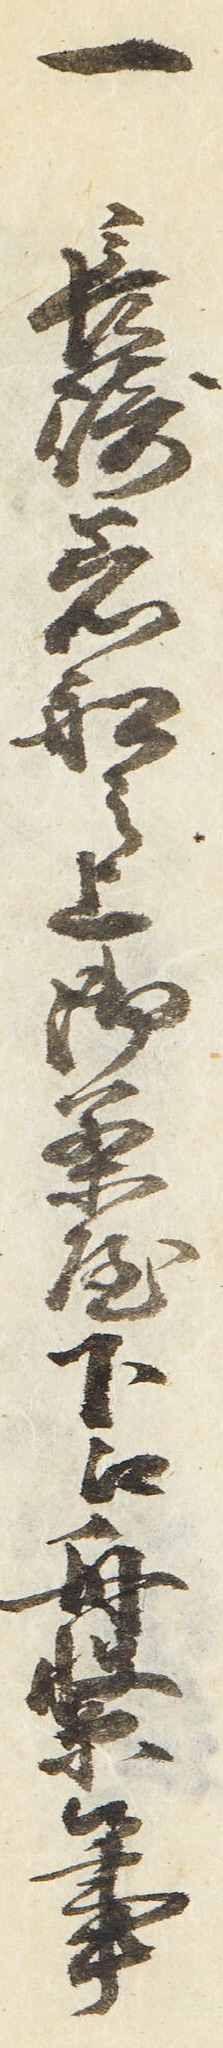一長崎着船之上御茶屋下江舟繋候事
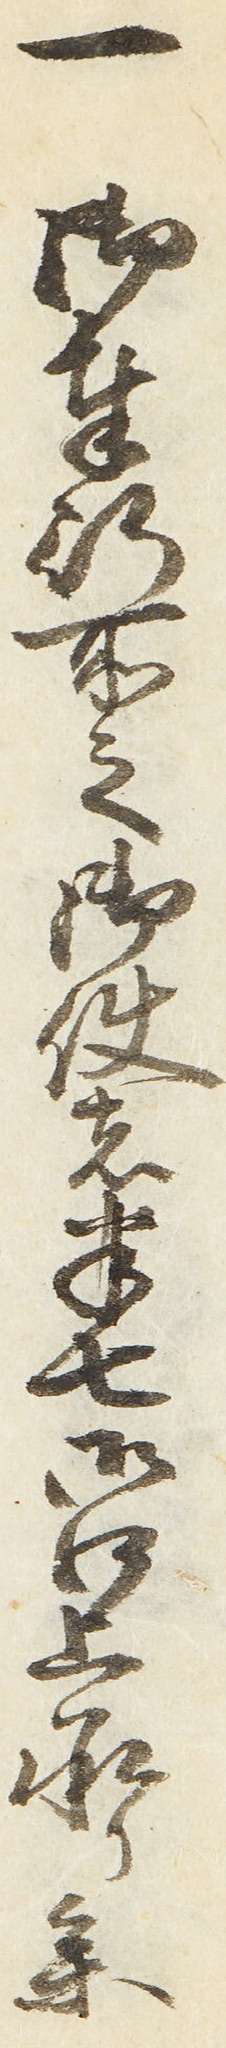一御奉行所之御使者半七御口上承り参
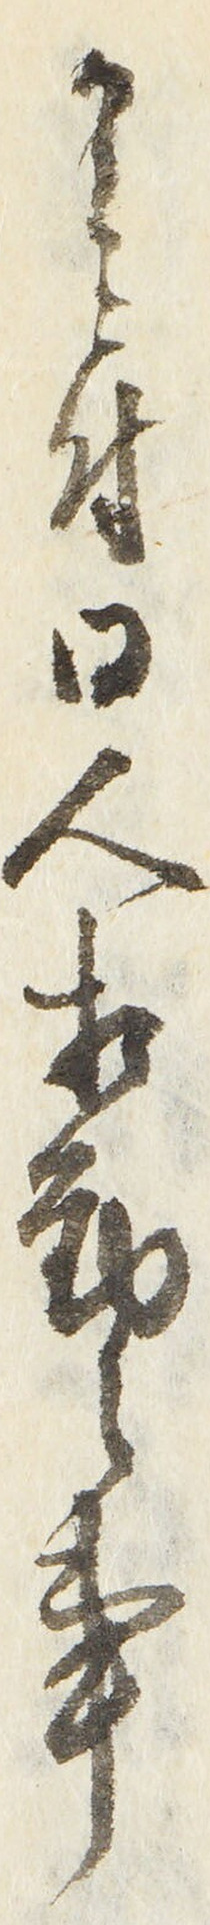候ニ付同人相勤候事
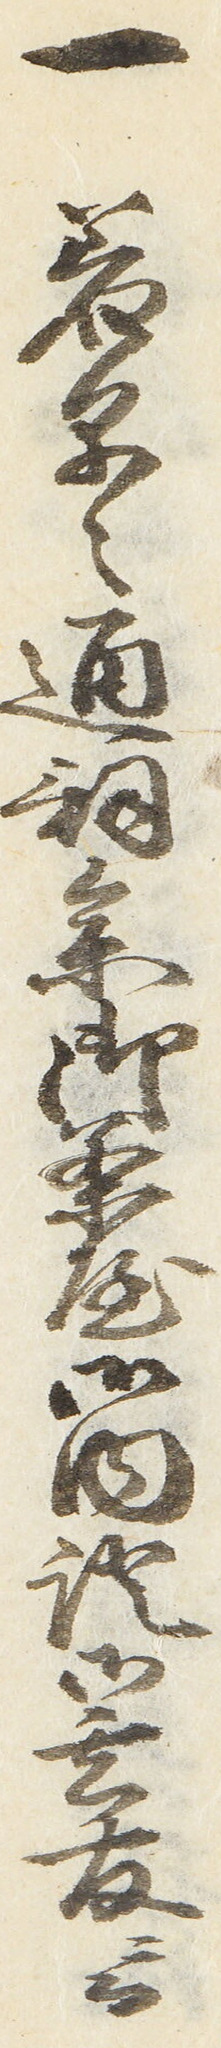一着早々通詞参御茶屋御内証御玄官ニ而
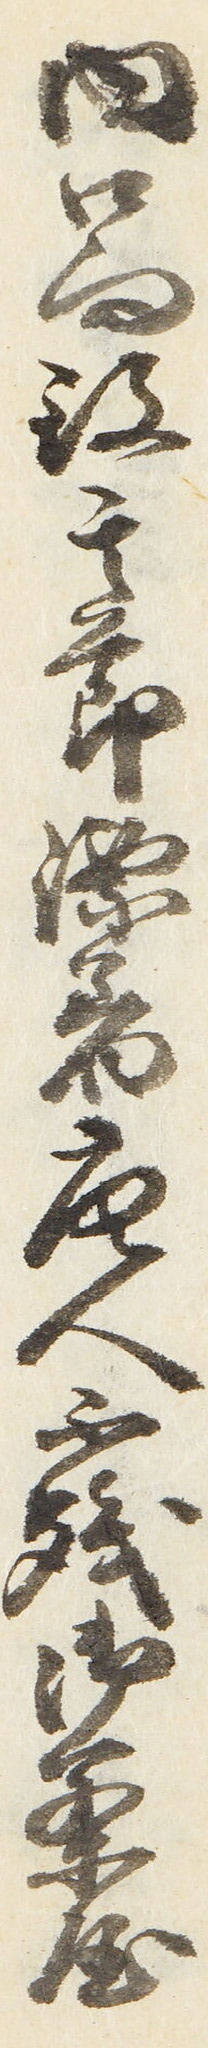内口向致其節漂着唐人不残御茶屋
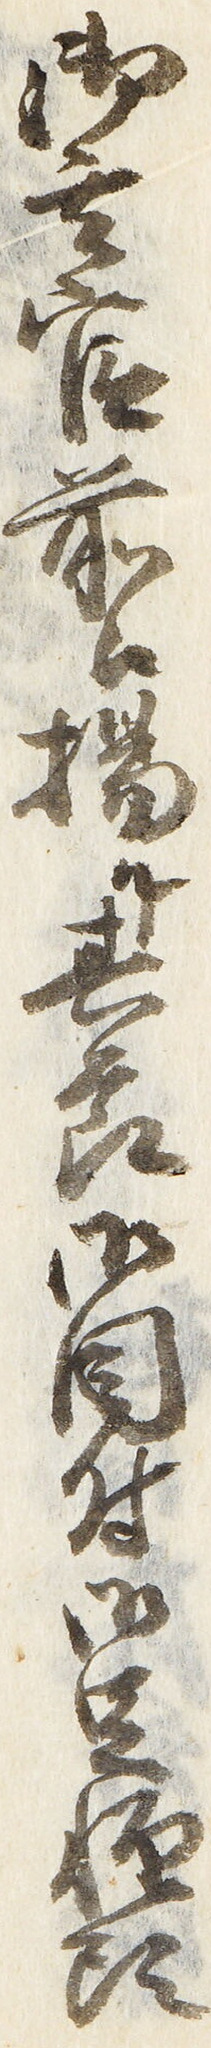御玄官前江揚ケ其節御目付御足軽頭
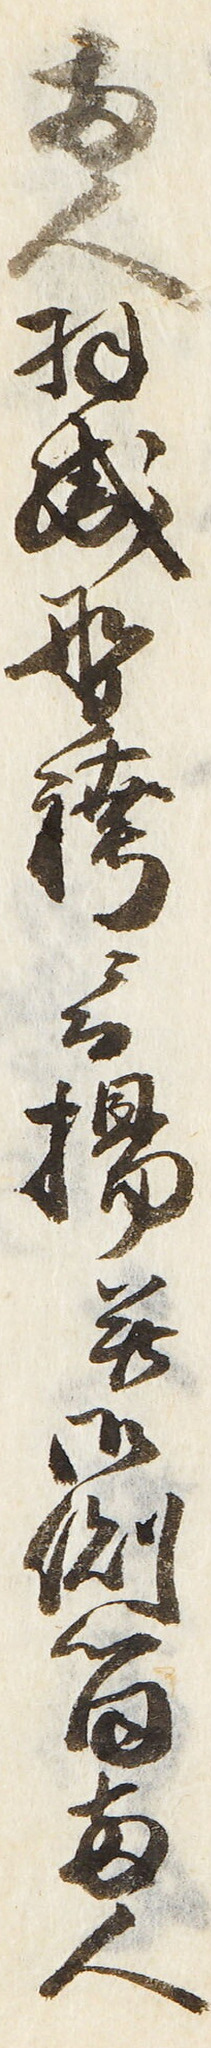両人羽織野袴ニ而揚并御側筒両人
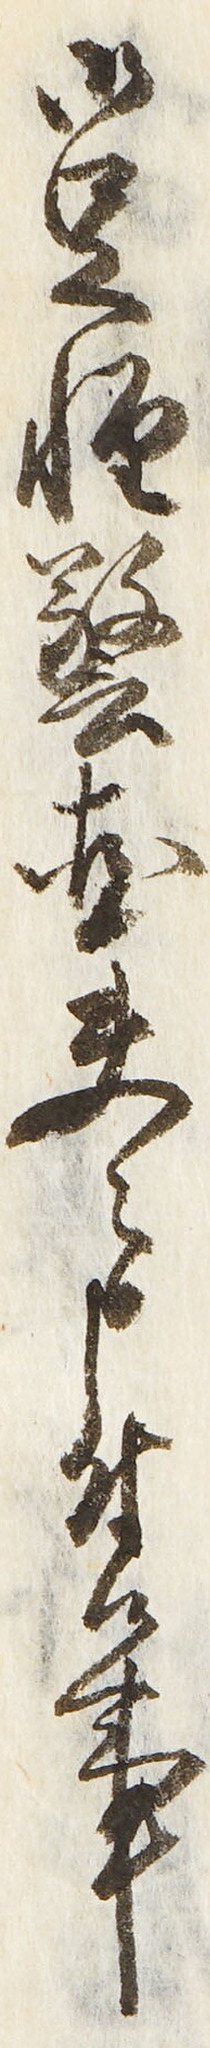御足軽警固夫々申付候事
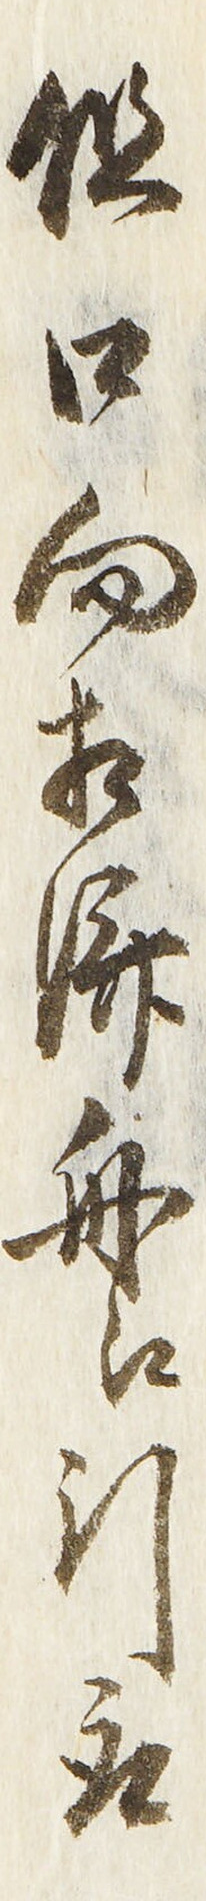但口向相済舟江引取
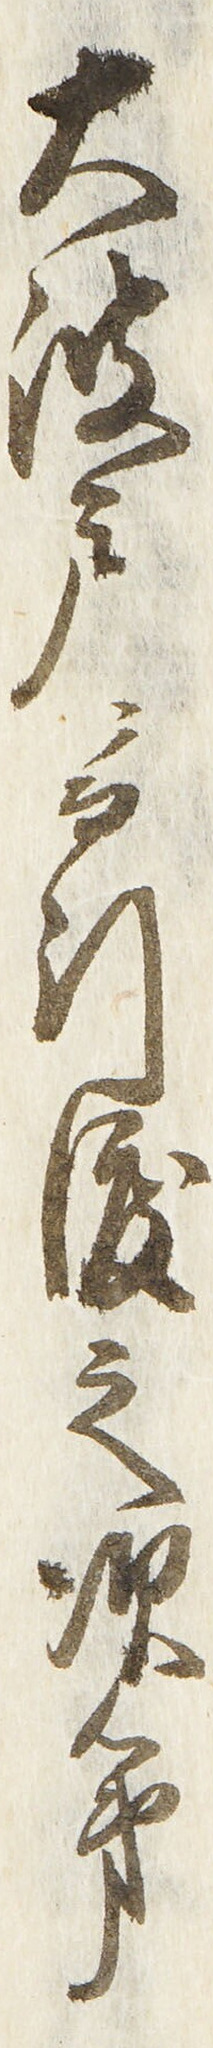大波戸ニ而引渡之次第
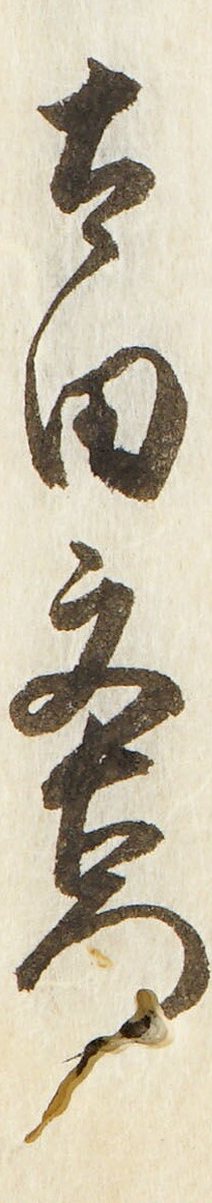太田文右衛門

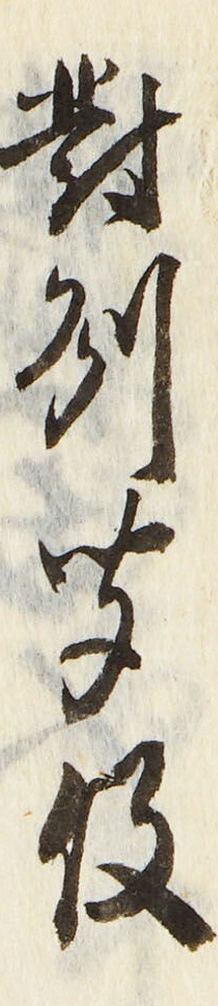対州聞役
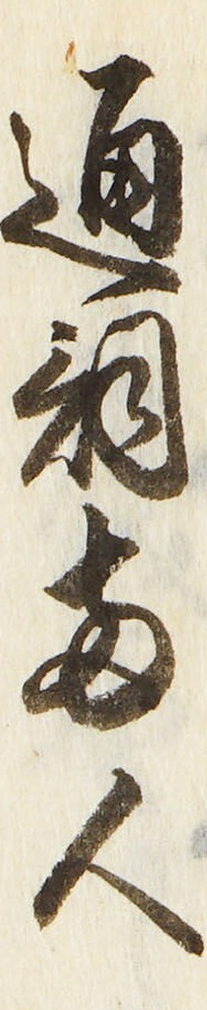通詞両人
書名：玄海嶋江漂着船為警固長崎江被越候覚
